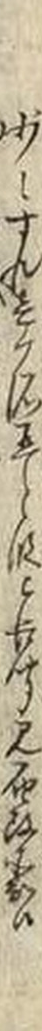少々すれ壱ケ所有之候段被仰聞見届致承知候
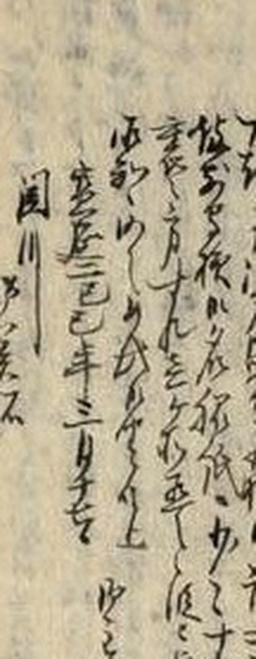承知候仍之如此御座候以上
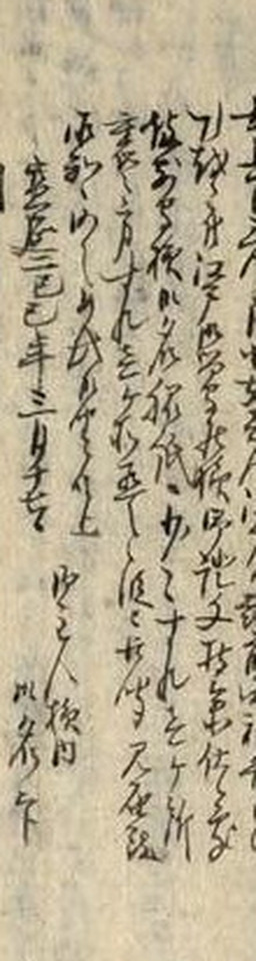裏之方すれ壱ケ所有之候段被仰聞見届致
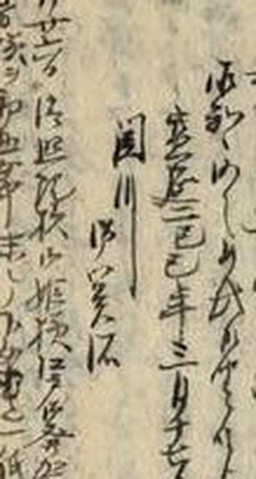関川御関所

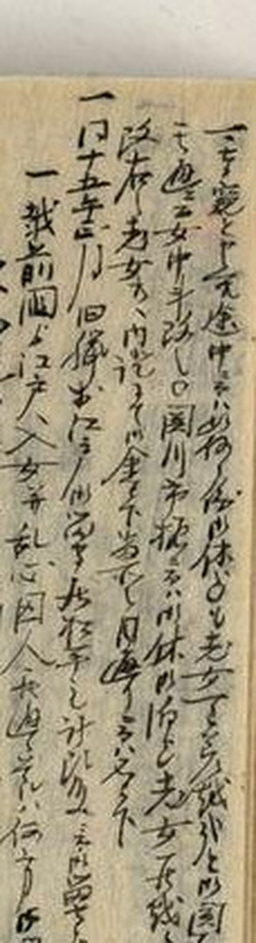改右之老女共へ内証にて御金被下当所之目通りニ而ハ不被下
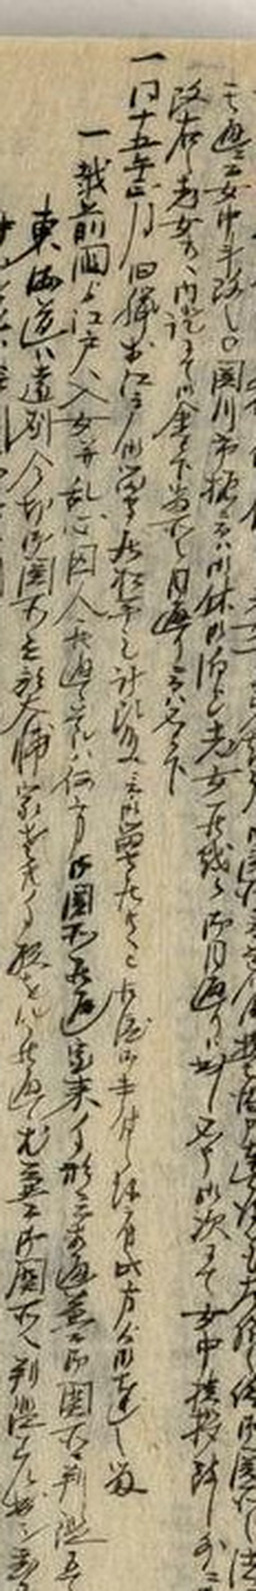一同十五午正月旧臘於江戸御留守居松平主計頭殿ニ而御留守居共へ被相渡候書付之趣ニ付此方ゟ御達之留
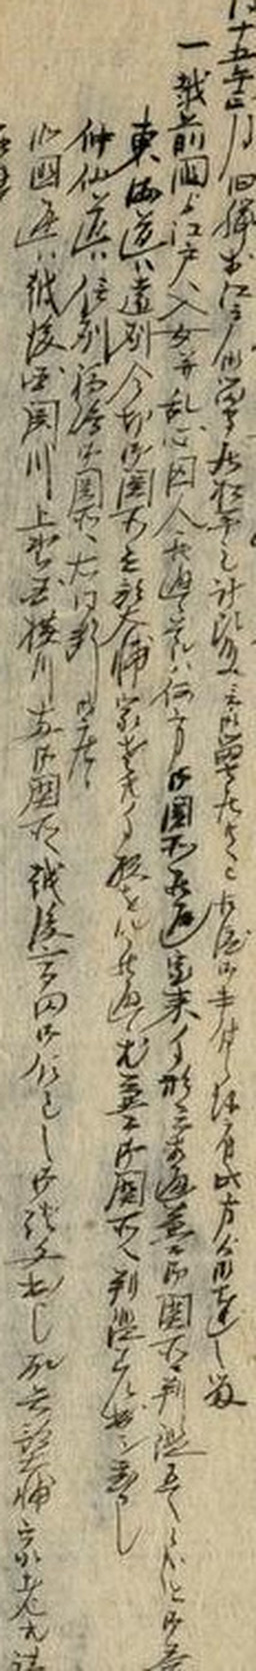東海道ハ遠州今切御関所兵部大輔家老共手形を以罷通候尤兼々御関所へ判鑑差出シ置申候
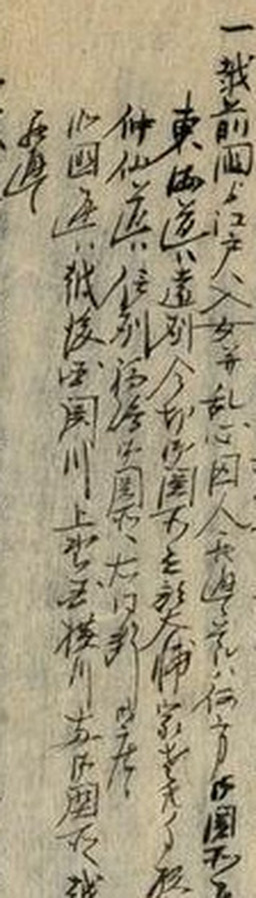仲仙道ハ信州福嶋御関所へ右同断御座候
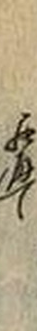罷通候
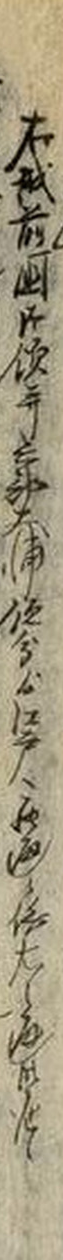右越前国御領幷兵部大輔領分ゟ江戸へ罷通候儀右之御座候
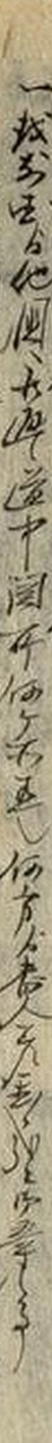一越前国ゟ他国へ罷通候道中関所何ケ所有之何方ゟ番人差置候哉と御尋候事
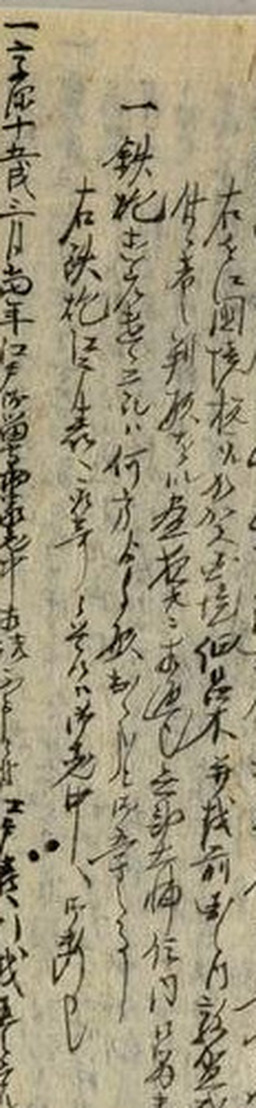一鉄炮等差遣候衆ハ何方ゟ手形出候哉と御尋候事
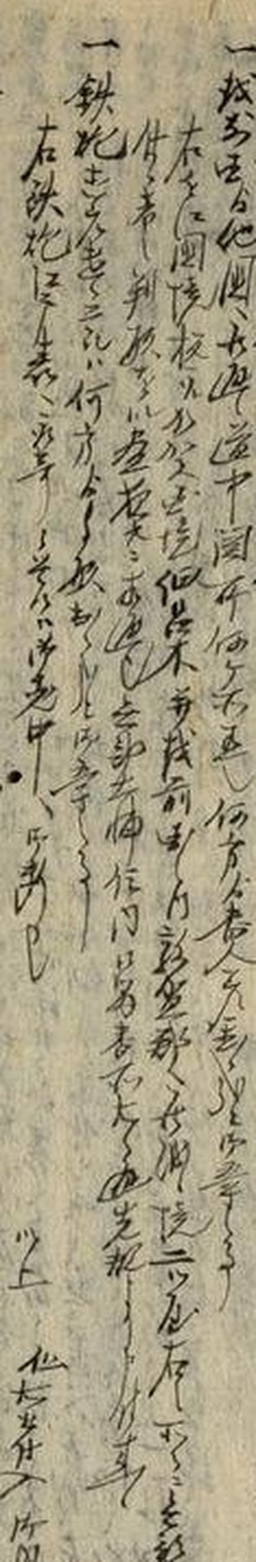付候者之判形を以昼夜共ニ相通申候兵部大輔領内口留番所右之通先規より申付来候
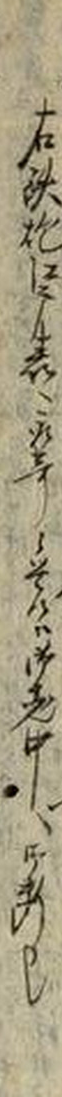右鉄炮江戸表へ取寄候節ハ御老中へ御断申候

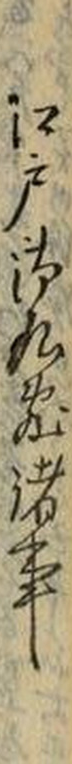江戸御屋敷諸事
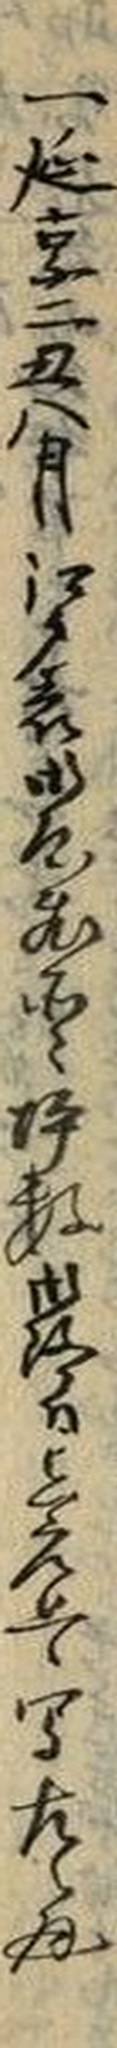一延享二丑八月江戸表御屋敷所々坪数御改ニ付被差上候写左之通
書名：御国他国諸事之部
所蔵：福井県文書館 Fukui Prefectural Archives
